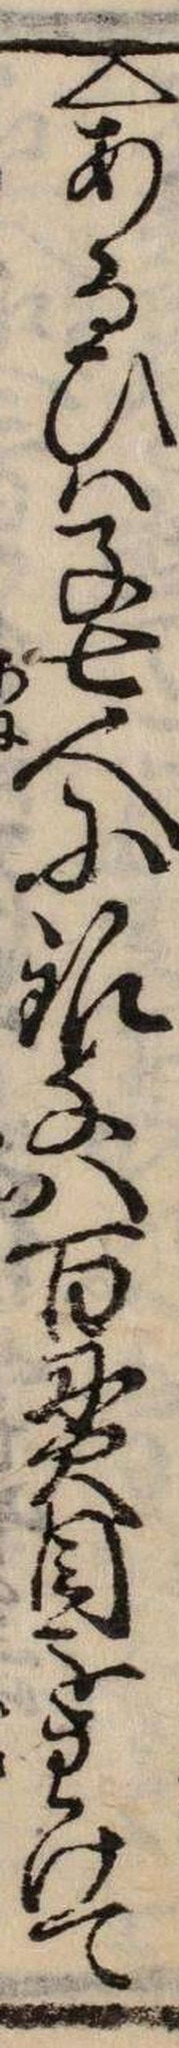△あるひは子七人に銀千八百貫目をわけて
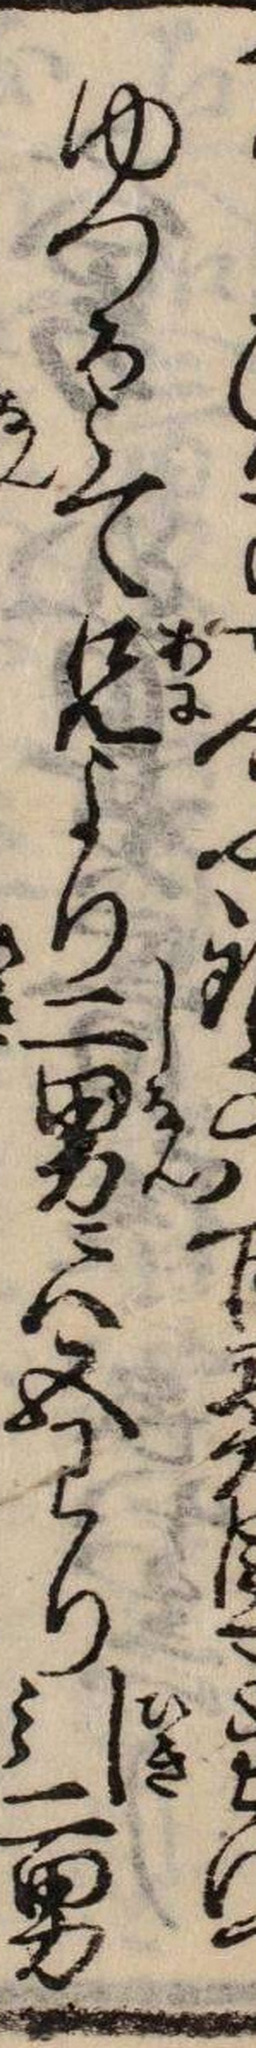ゆつるとて兄より二男には五わり引二男
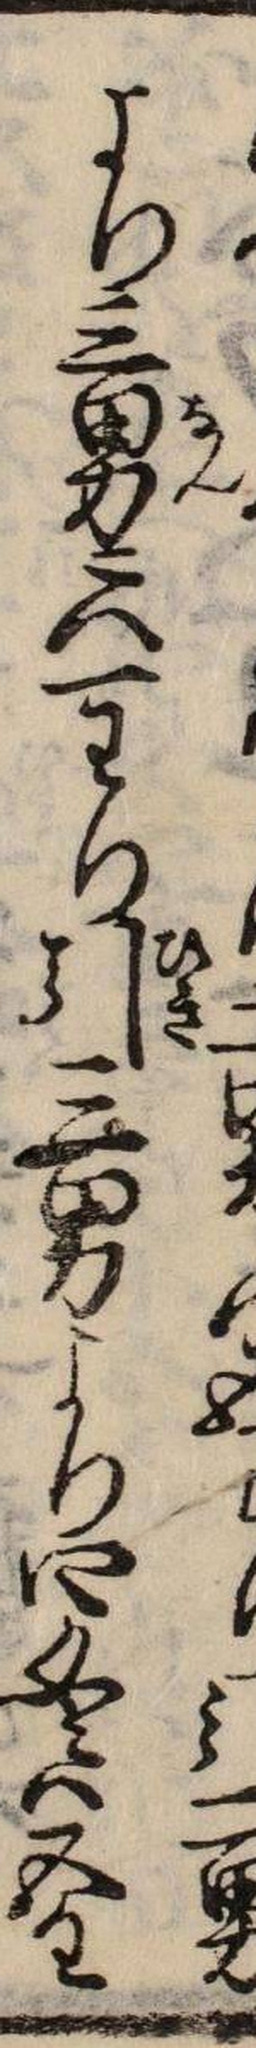より三男には一わり引三男より四は五わ
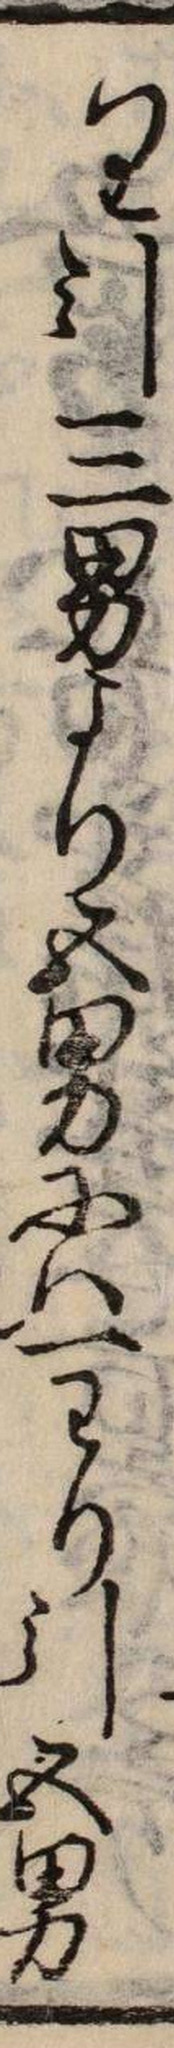り引三男より五男には一わり引五男
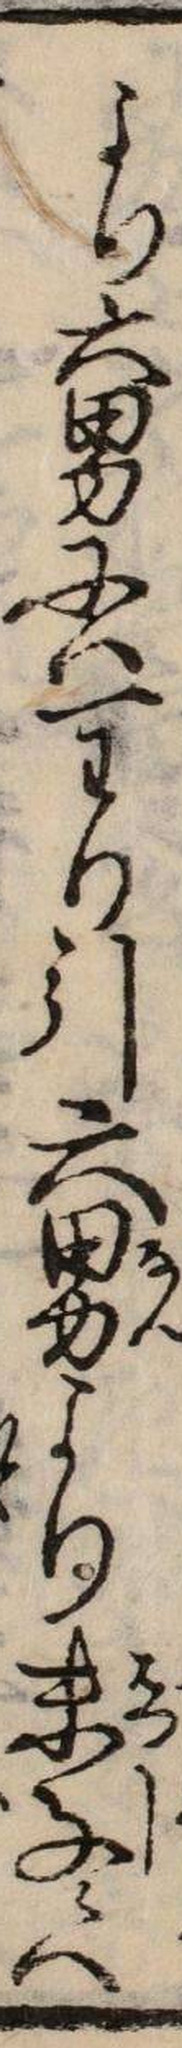より六男には一わり引六男より未子には
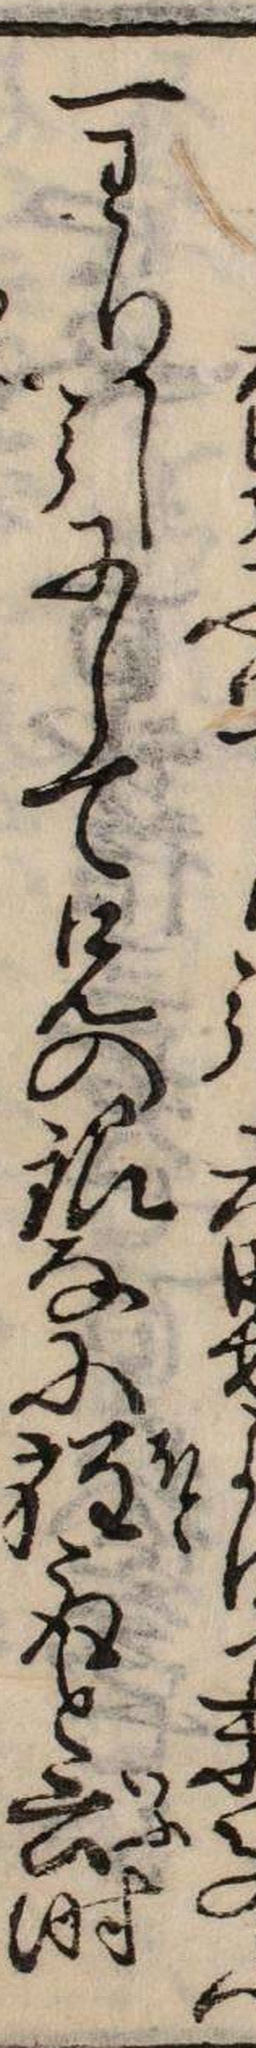一わり引にして兄の銀なに程取と云時
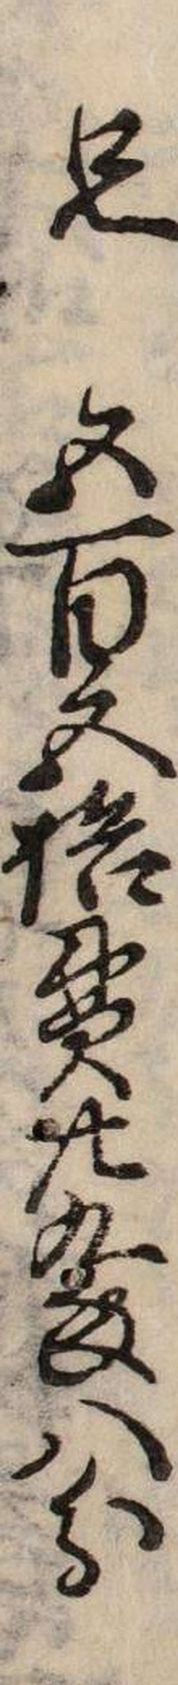兄五百五拾貫廿九匁八分
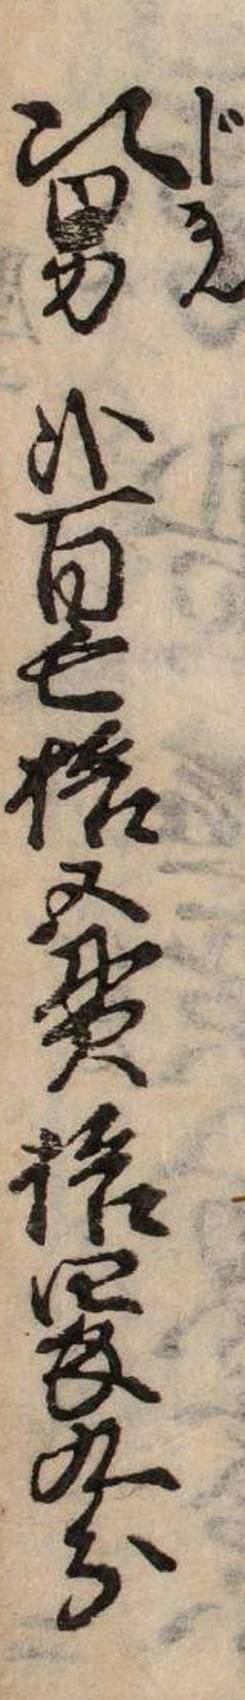次男弐百七拾五貫拾四匁九分

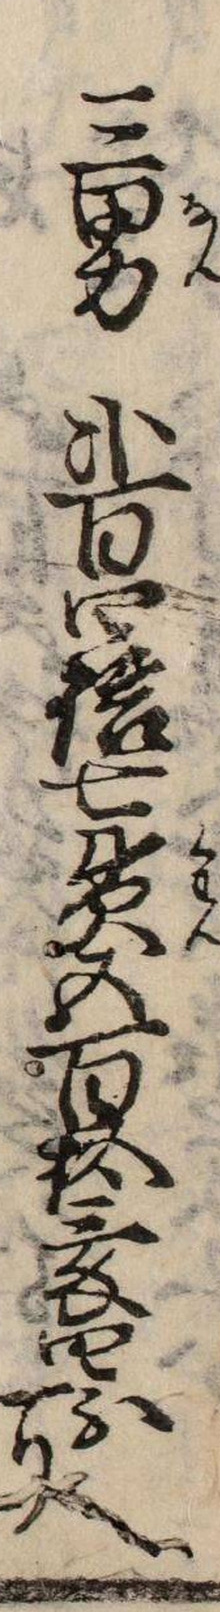三男弐百四拾七貫五百拾三匁四分一り
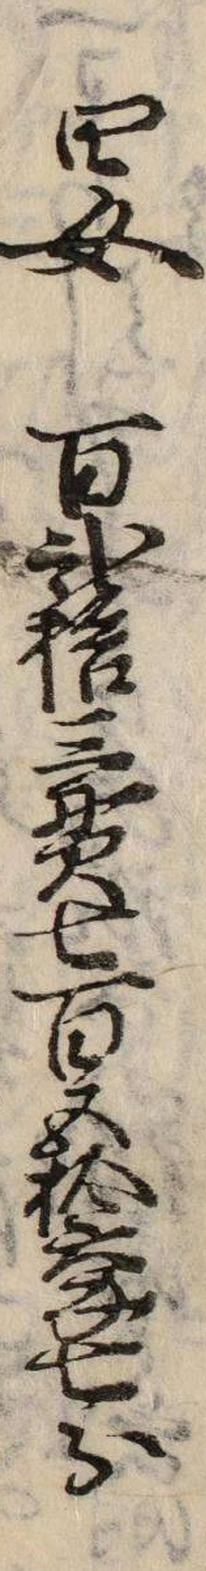四女百弐拾三貫七百五拾六匁七分
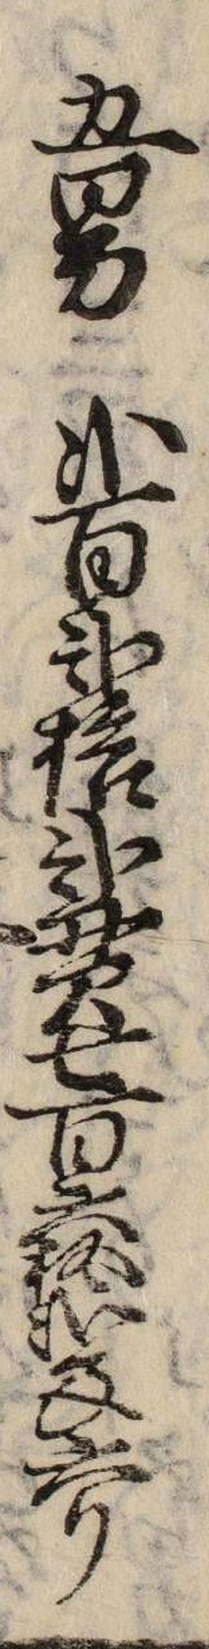五男弐百弐拾弐貫七百六拾弐匁六り
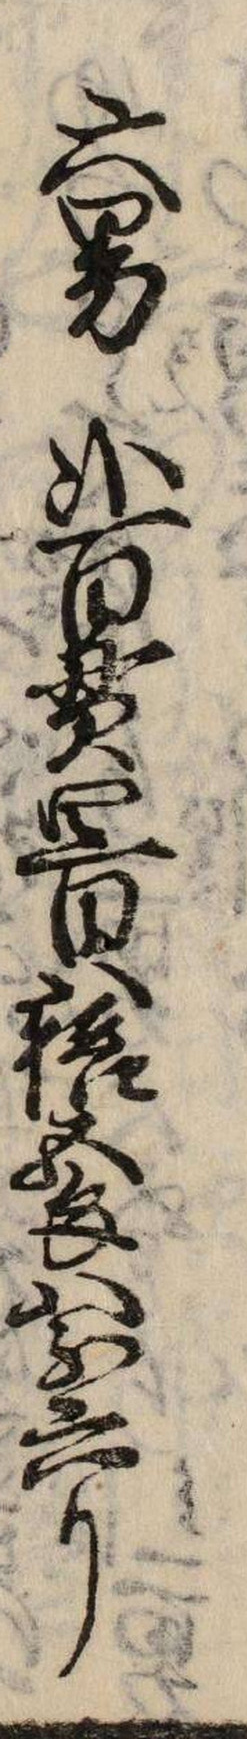六男弐百貫四百八拾五匁八分六り
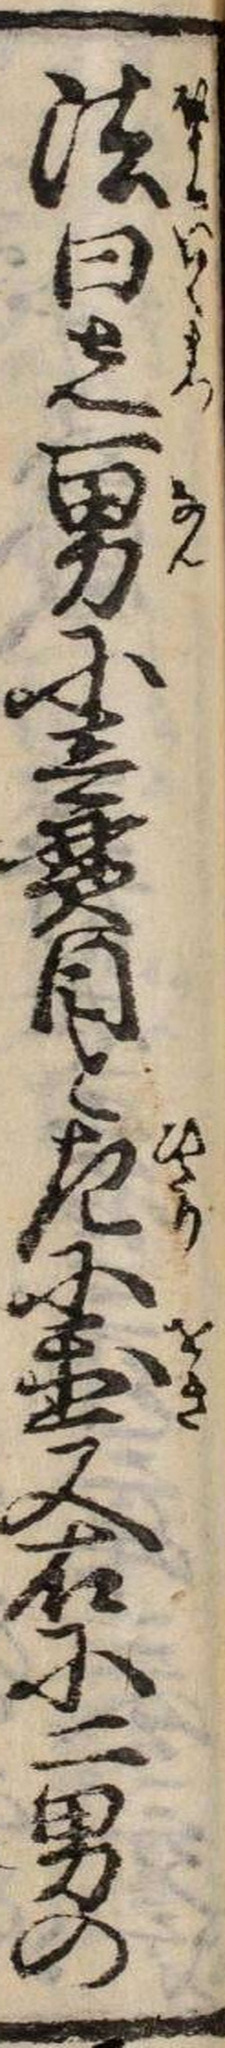法曰先一男に壱貫目と左に置又右に二男の
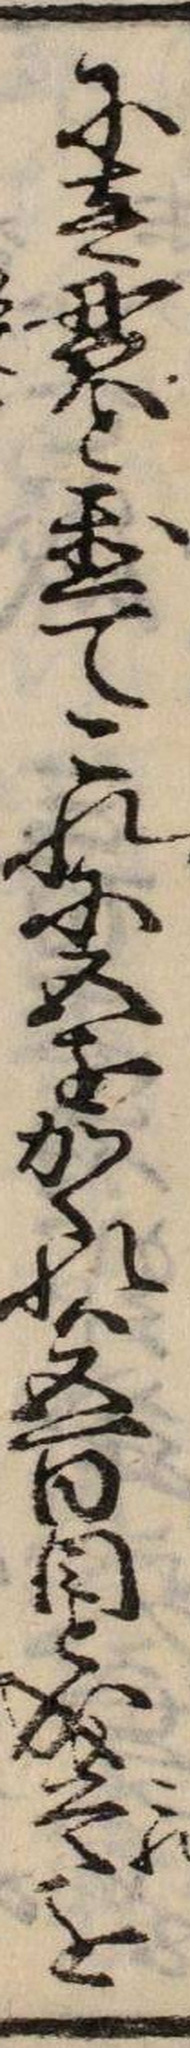に壱貫と置てこれに五をかくれは五百目と成是を
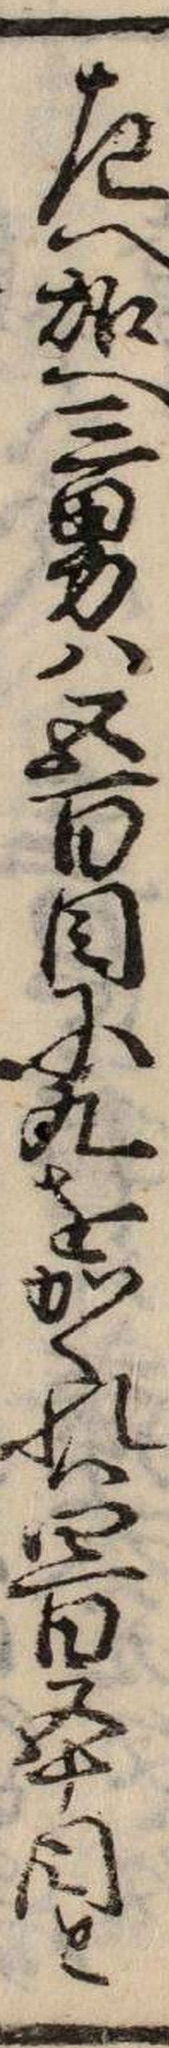左へ加へ三男は五百目に九をかくれは四百五十目と
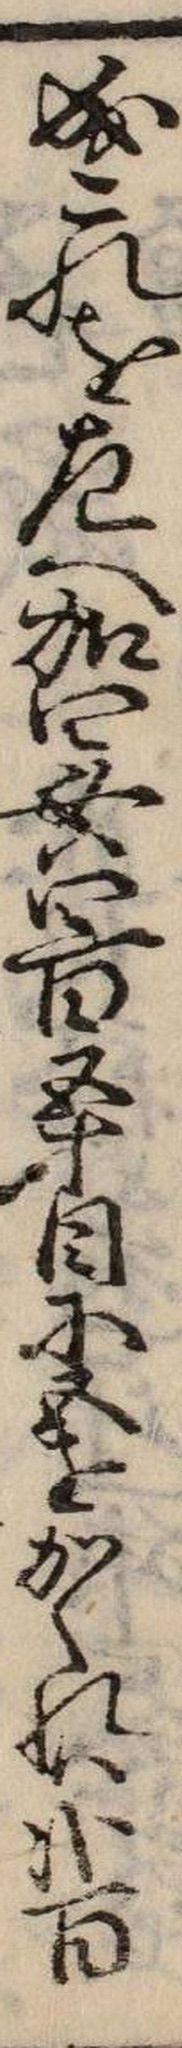成これを左へ加四女は四百五十目に五をかくれは弐百
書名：塵劫記（寛永11年自跋、京都府立京都学・歴彩館追貴8）
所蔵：京都府立京都学・歴彩館 国文学研究資料館
